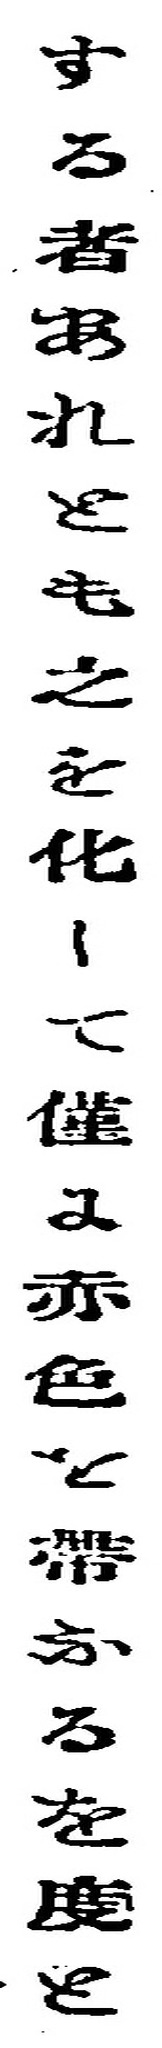する者あれとも之を化して僅に赤色を帯ふるを度と
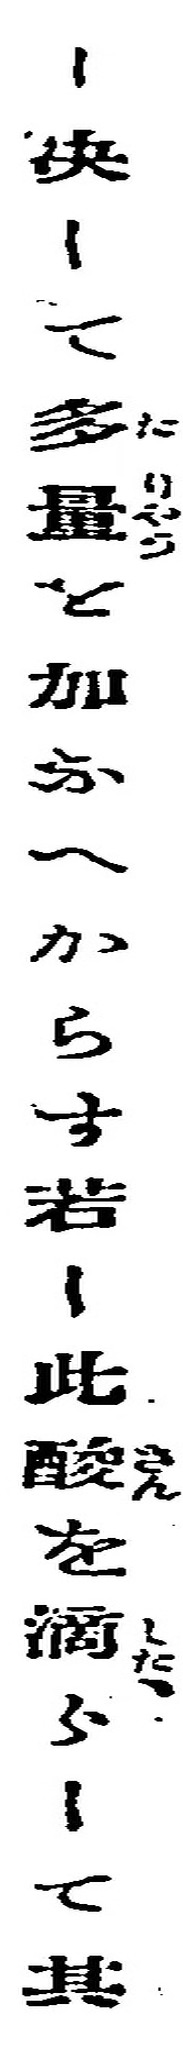し決して多量を加ふへからす若し此酸を滴らして其
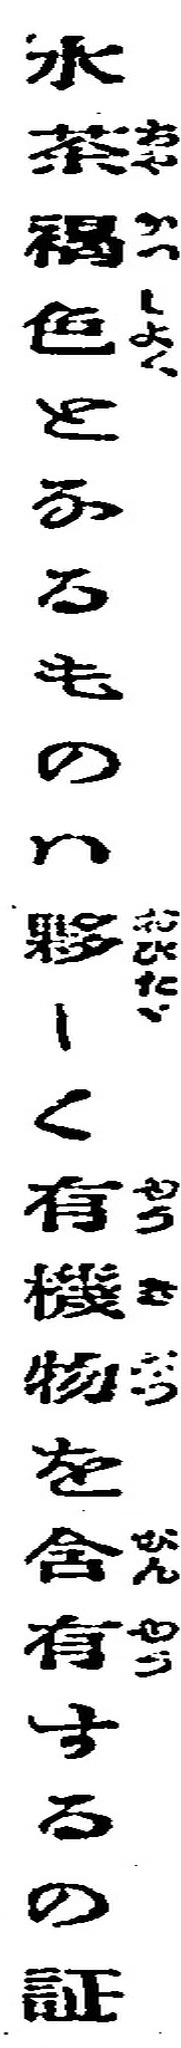水茶褐色となるものは夥しく有機物を含有するの証
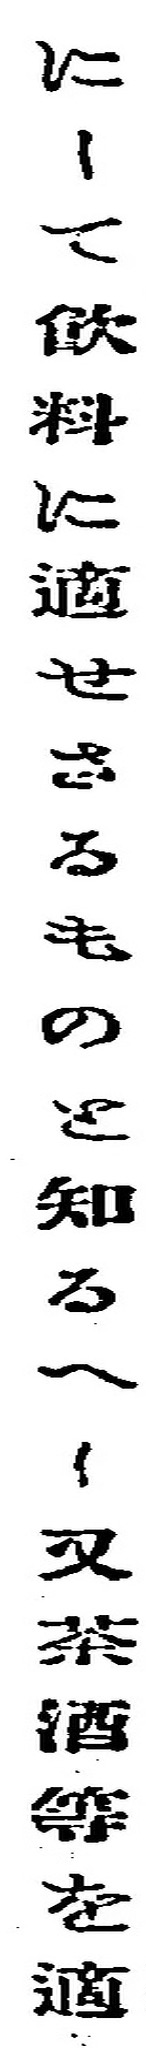にして飲料に適せさるものと知るへし又茶酒等を適
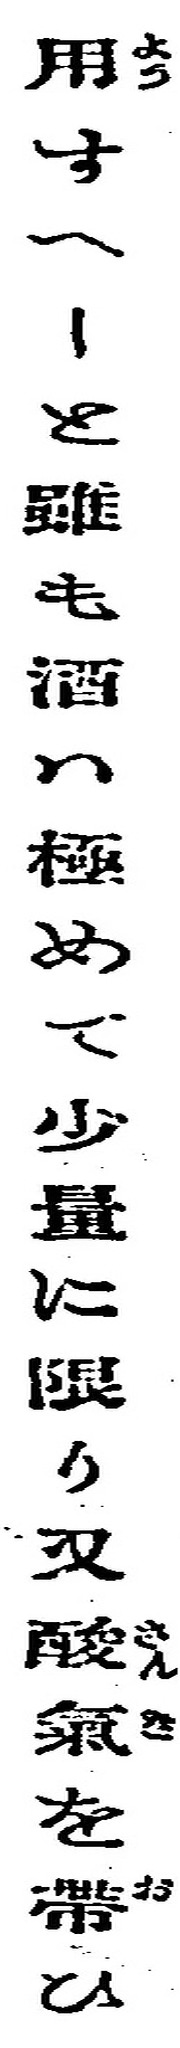用すへしと雖も酒は極めて少量に限り又酸気を帯ひ
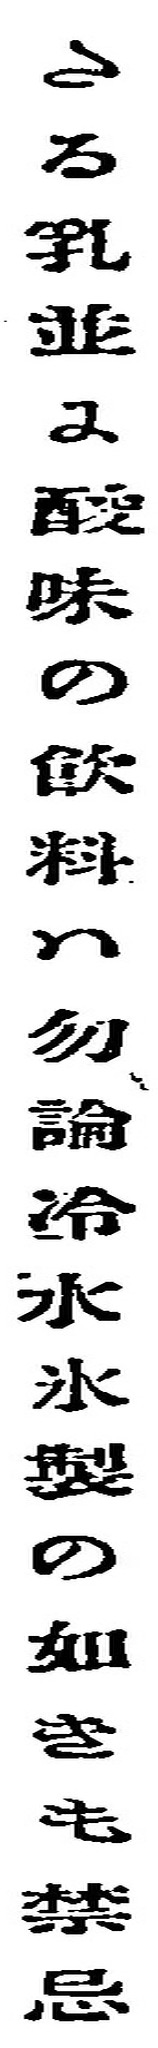たる乳並に酸味の飲料は勿論冷水氷製の如きも禁忌
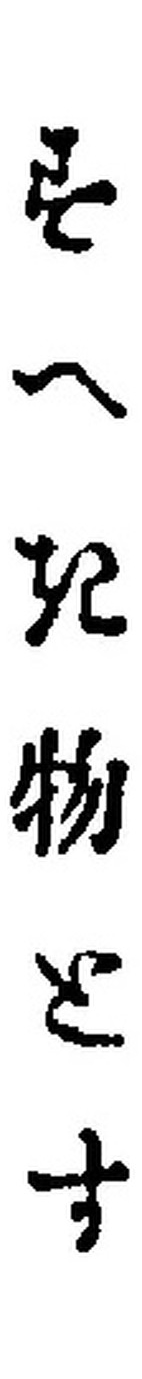すへき物とす
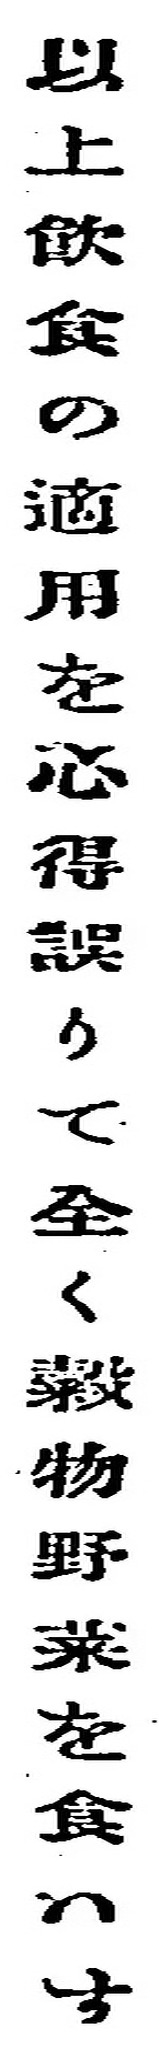以上飲食の適用を必得誤りて全く穀物野菜を食はす
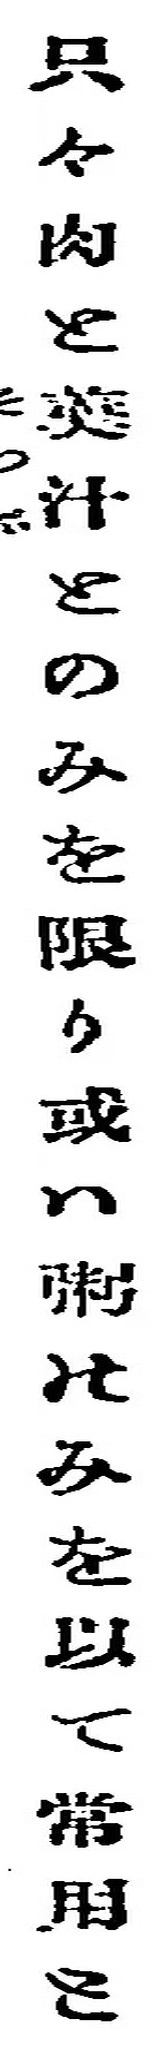只々肉と羹汁とのみを限り或は粥のみを以て常用と
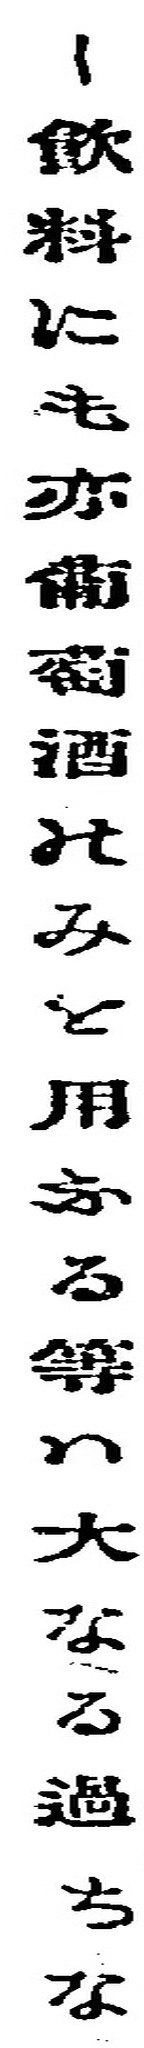し飲料にも亦葡萄酒のみを用ふる等は大なる過ちな
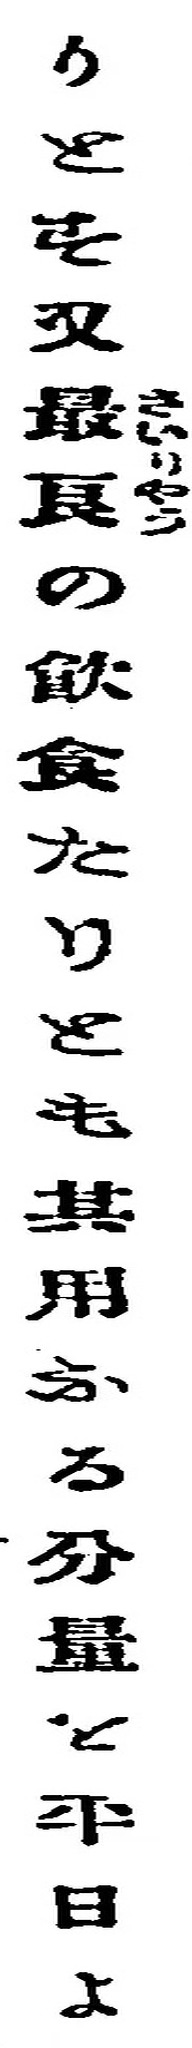りとす又最良の飲食たりとも其用ふる分量を平日よ
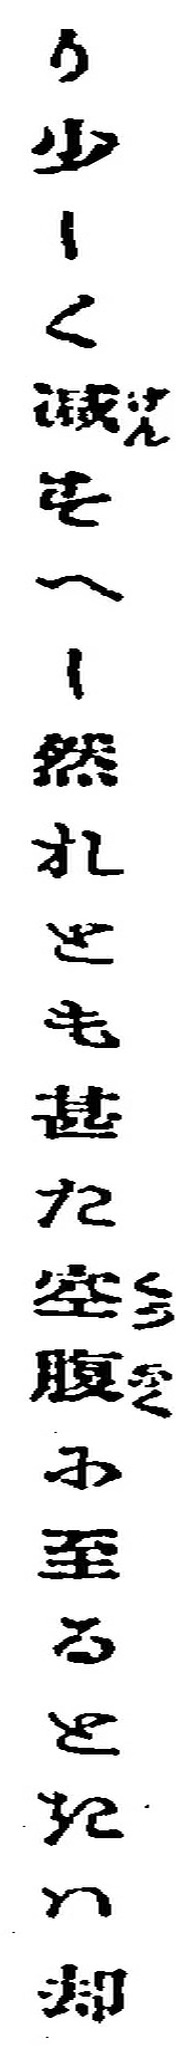り少しく減すへし然れとも甚た空腹に至るときは却
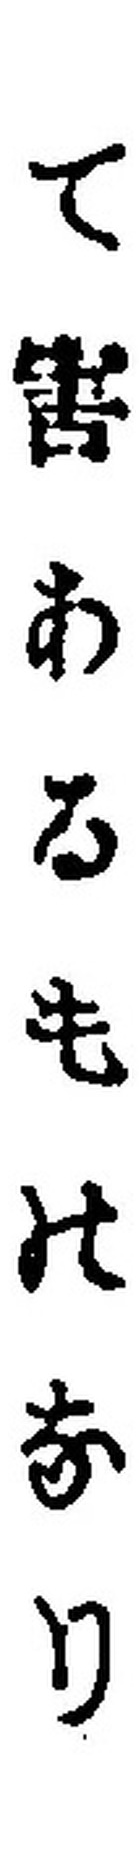て害あるものなり
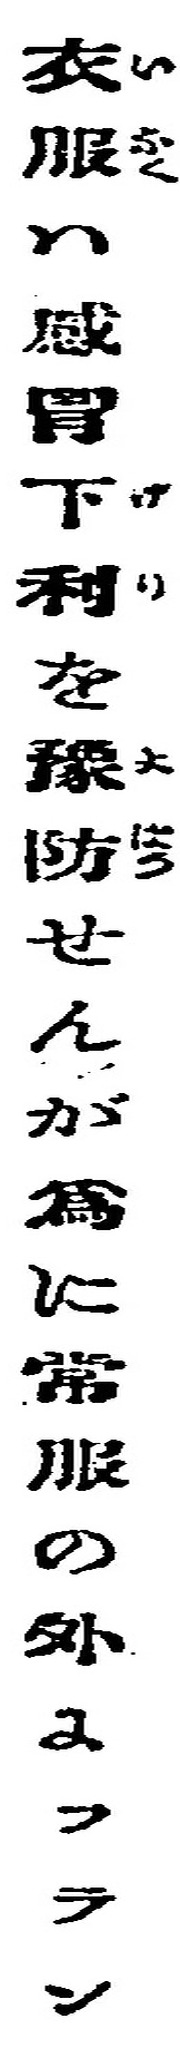衣服は感胃下利を予防せんが為に常服の外にフラン
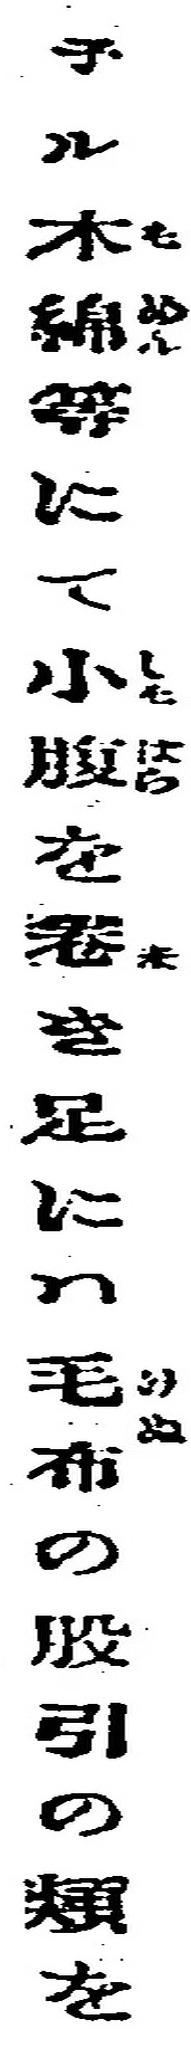ネル木綿等にて小腹を巻き足には毛布の股引の類を

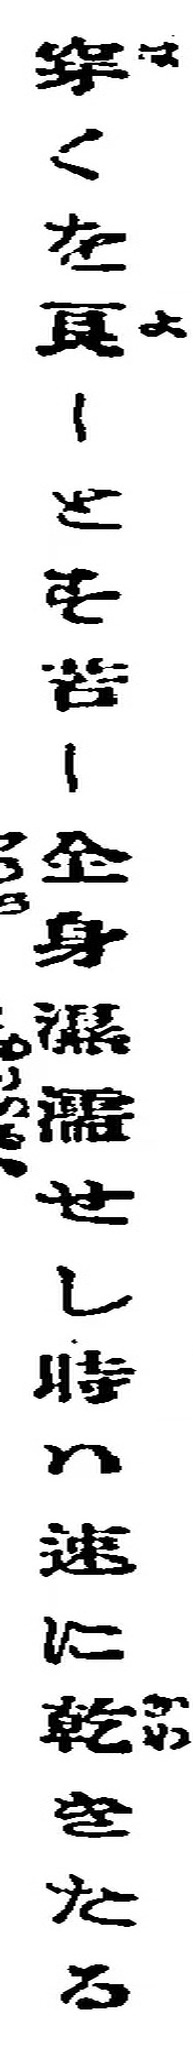穿くを良しとす若し全身濡せし時は速に乾きたる
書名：これら病予防心得
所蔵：国立国会図書館 National Diet Library, JAPAN
